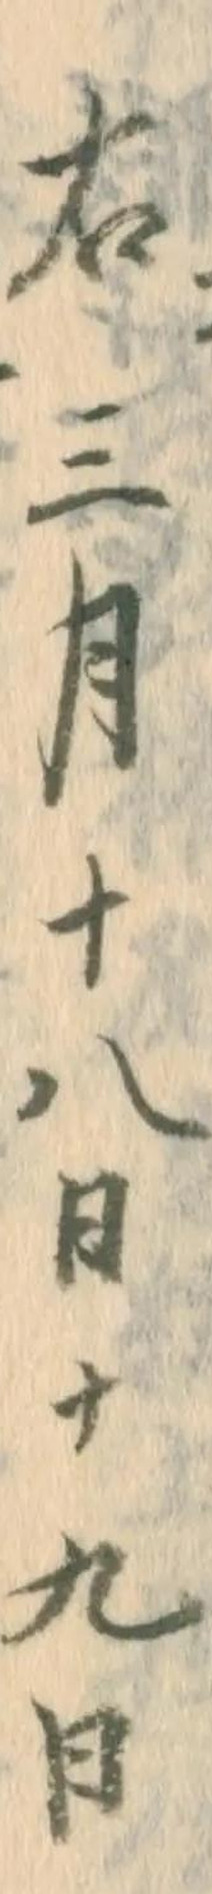右三月十八日十九日

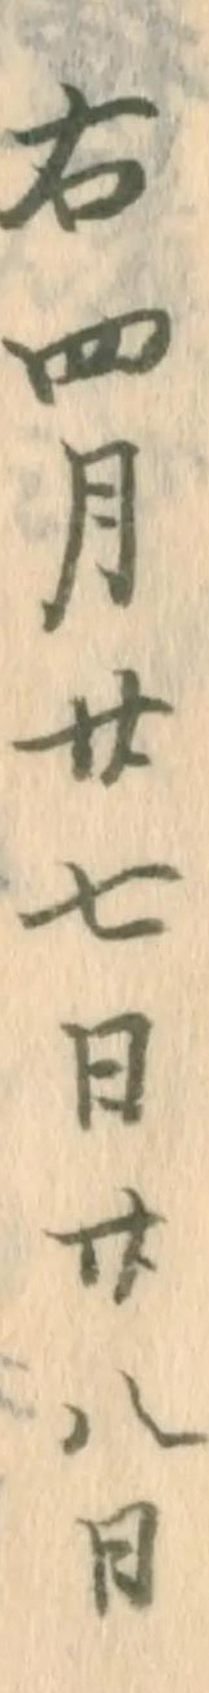右四月廿七日廿八日
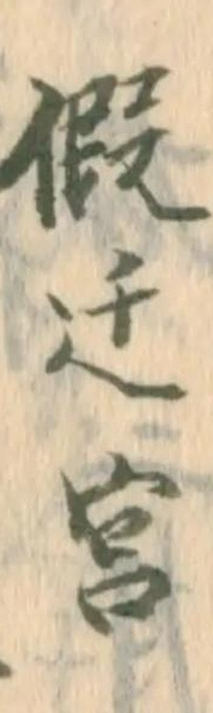仮迁宮
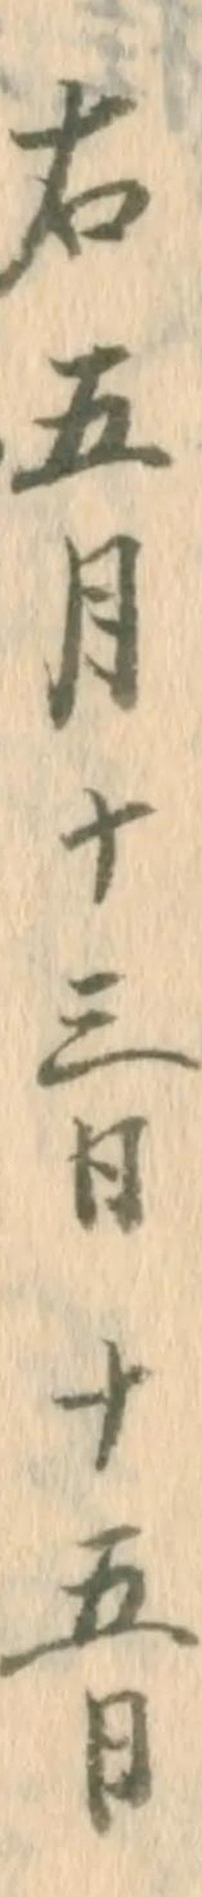右五月十三日十五日
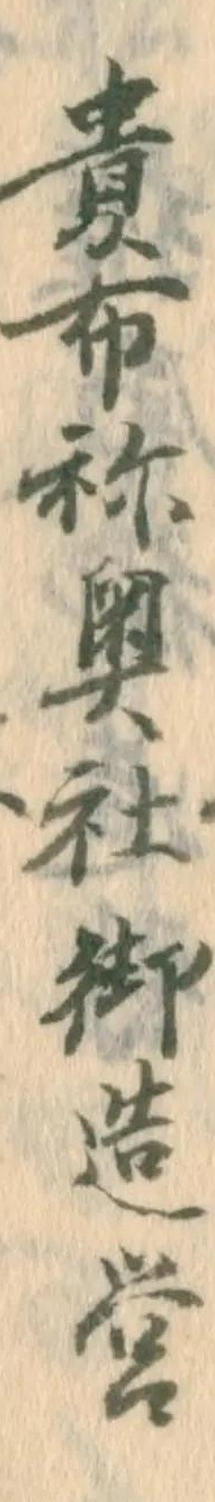貴布祢奥社御造営
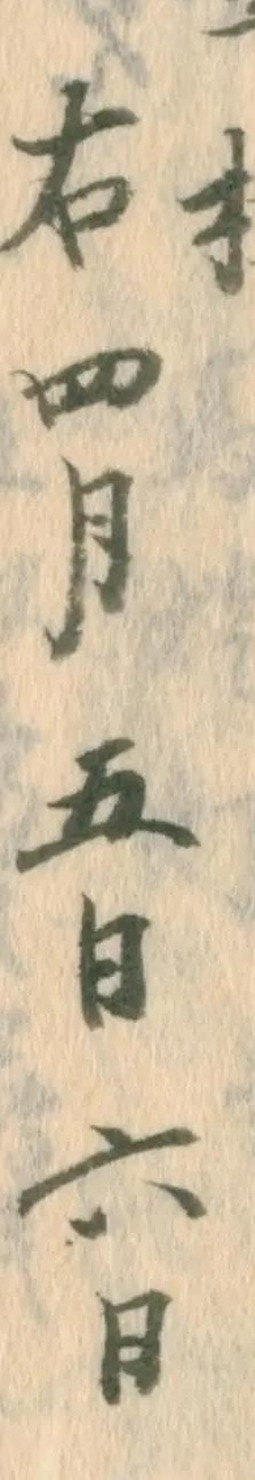右四月五日六日
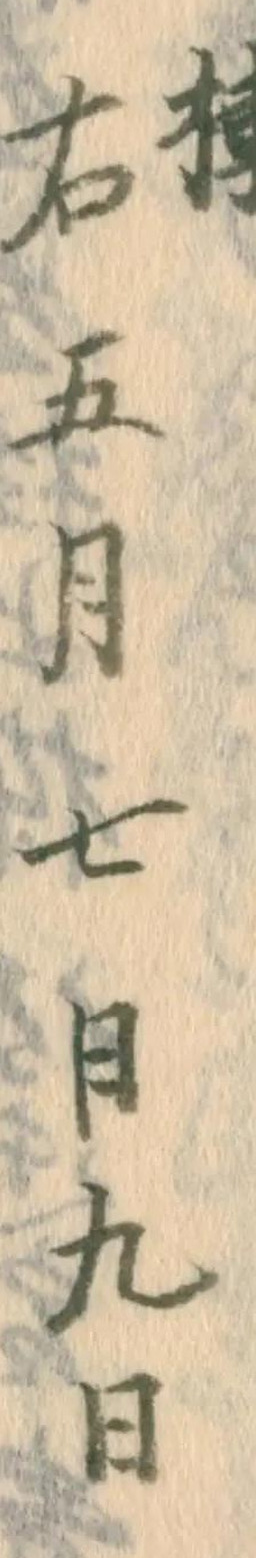右五月七日九日
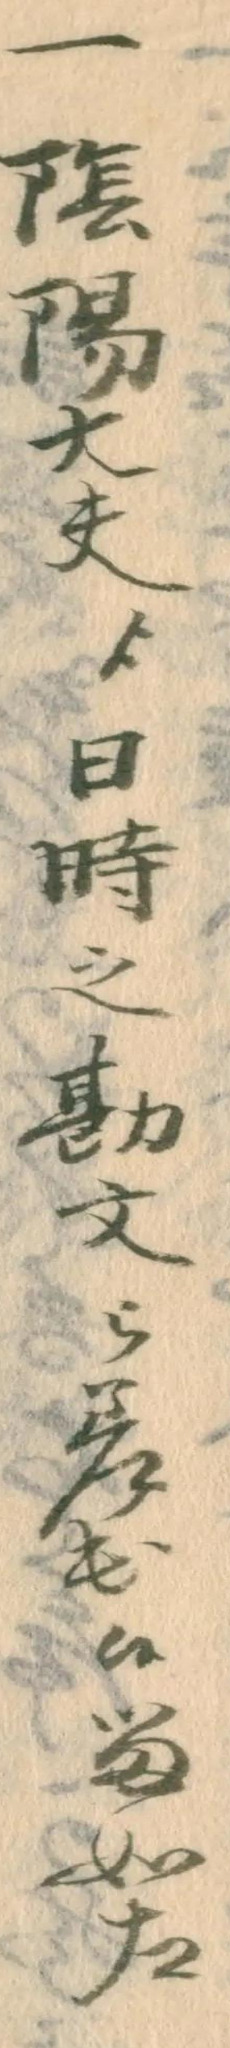一陰陽大夫ゟ日時之勘文被差出候留如左
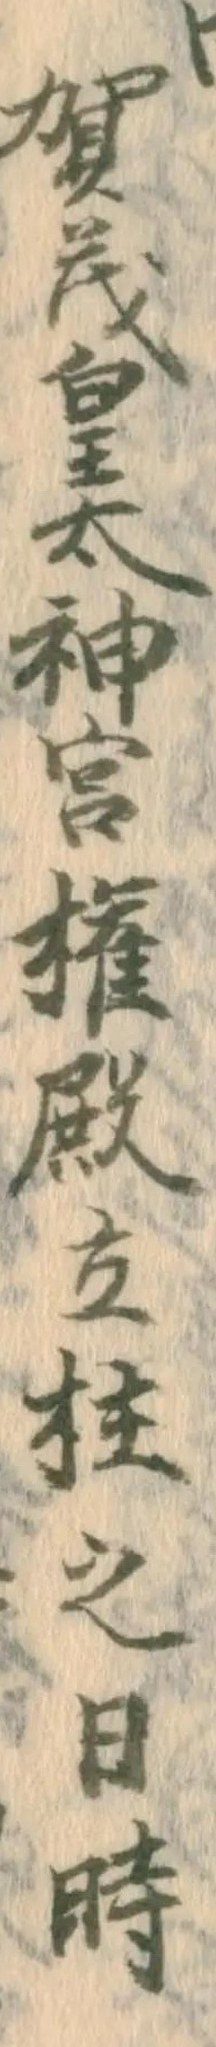賀茂皇太神宮権殿立柱之日時
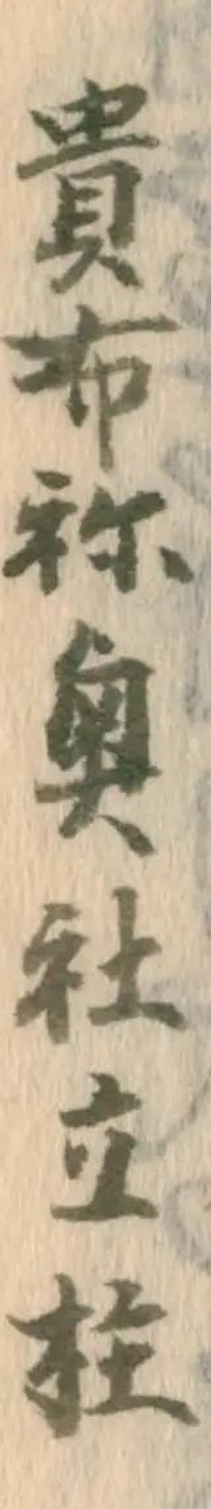貴布祢奥社立柱
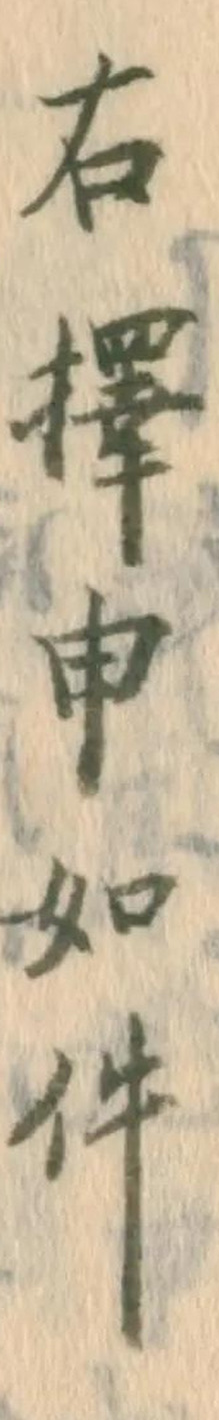右択申如件
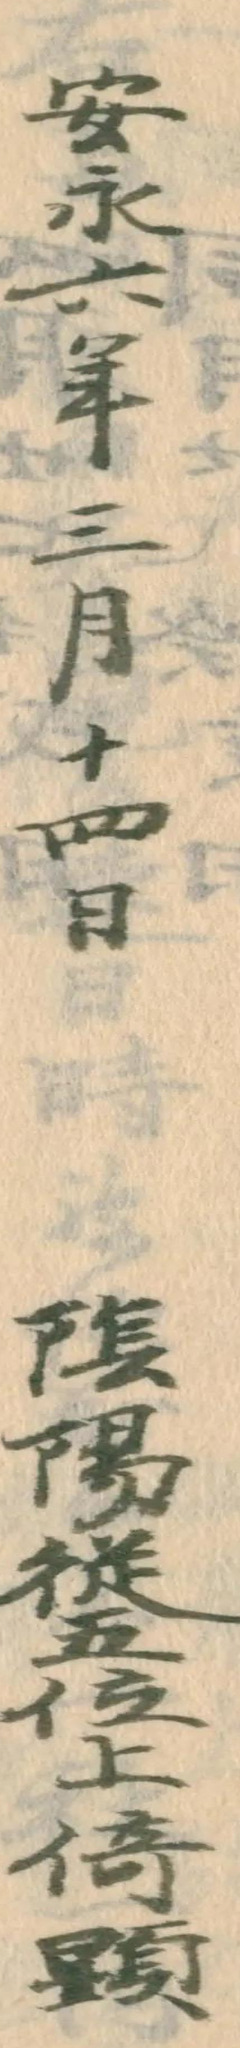安永六年三月十四日陰陽従五位上倚顕
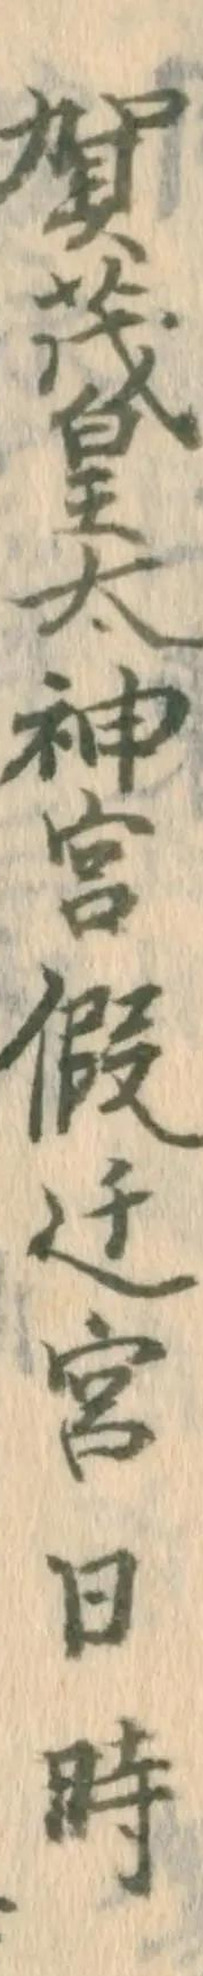賀茂皇太神宮仮迁宮日時
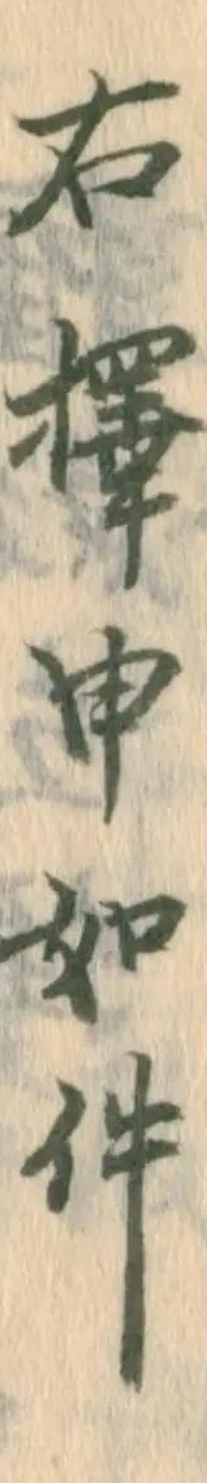右択申如件
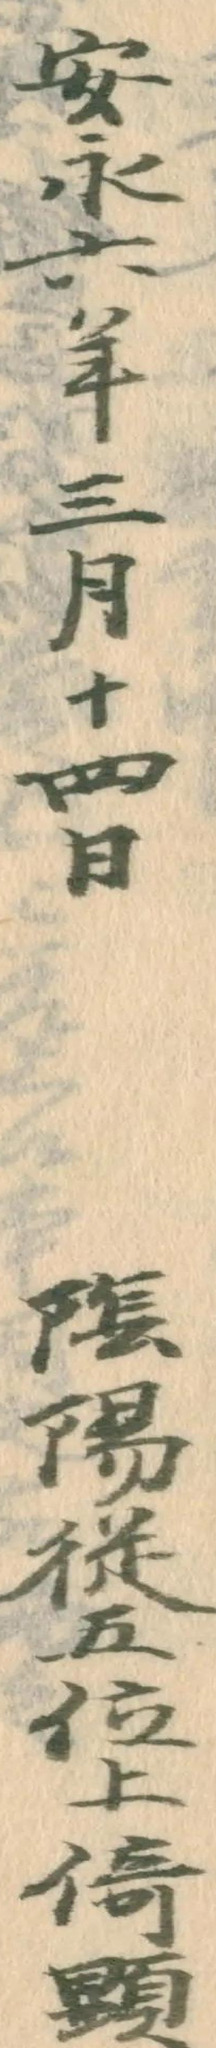安永六年三月十四日陰陽従五位上倚顕
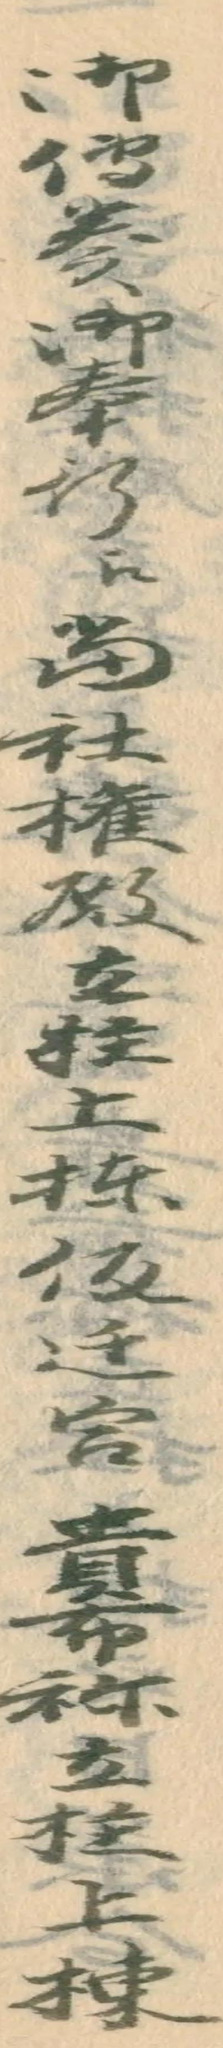一御伝奏御奉行江当社権殿立柱上棟仮迁宮貴布祢立柱上練
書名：賀茂社記録. 第17冊
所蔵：国立国会図書館 National Diet Library, JAPAN
